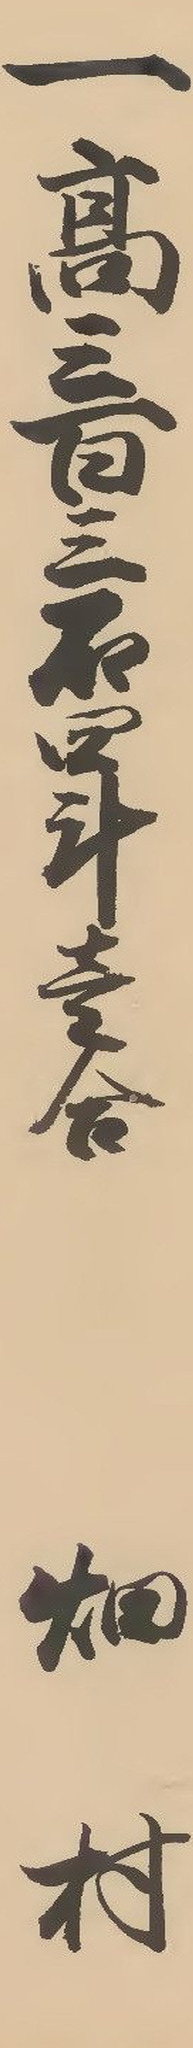一髙三百三石四斗壱合畑村
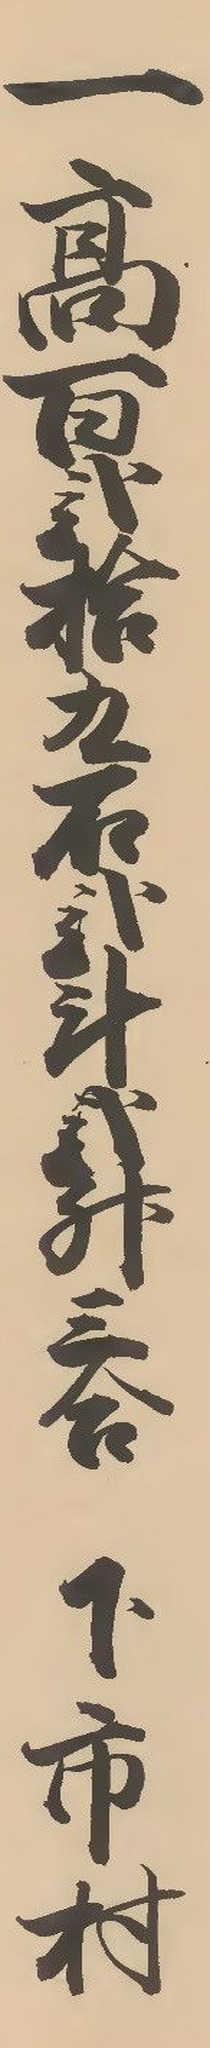一髙百弐拾九石弐斗弐升三合下市村
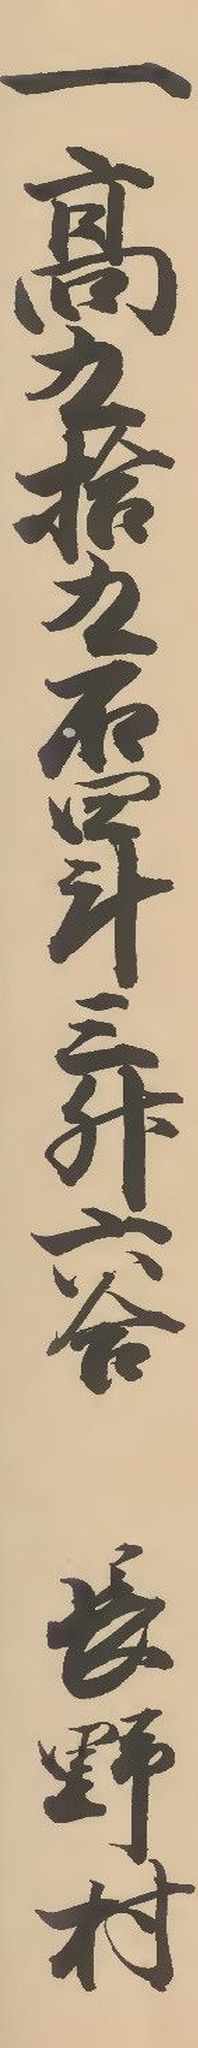一髙九拾九石四斗三升六合長野村
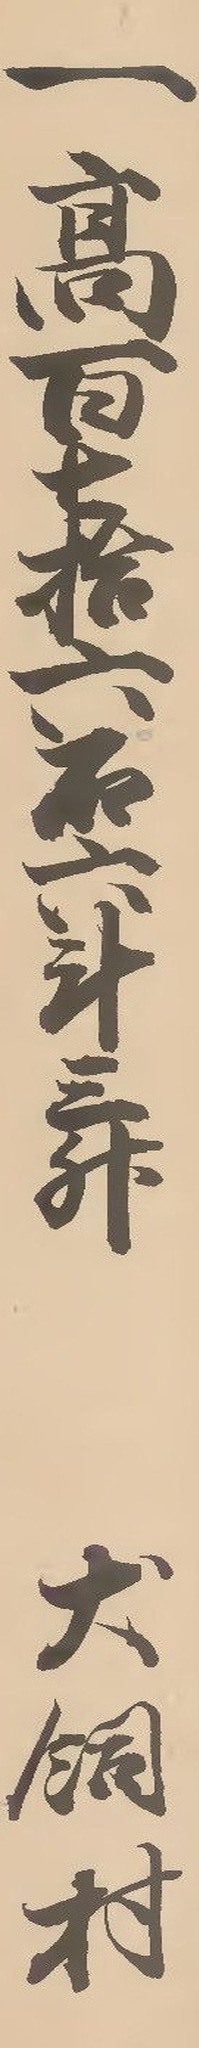一髙百七拾六石六斗三升犬飼村
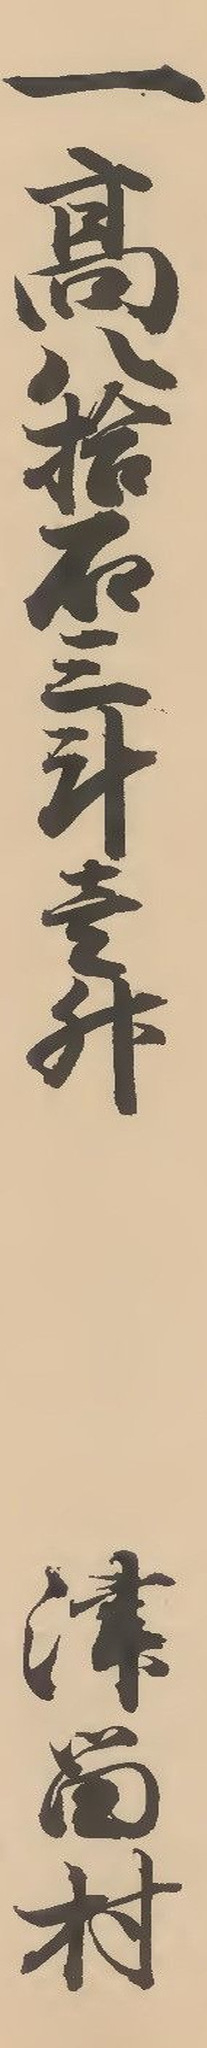一髙八拾石三斗壱升津留村
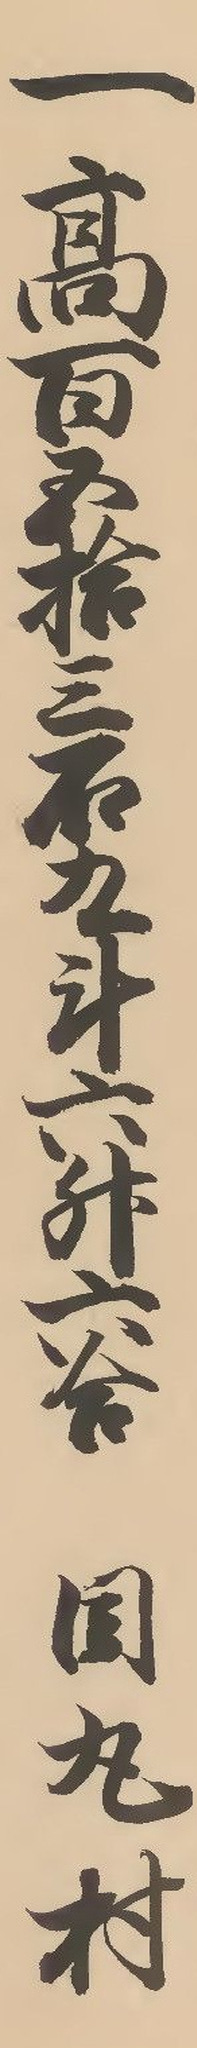一髙百五拾三石九斗六升六合目丸村
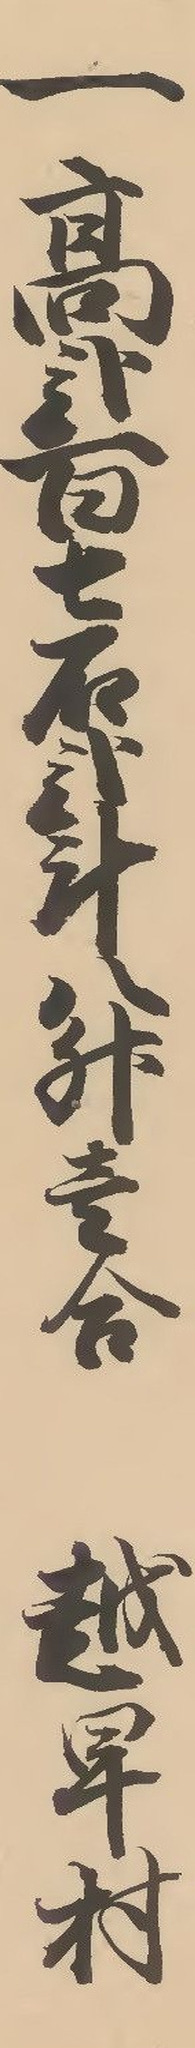一髙弐百七石弐斗八升壱合越早村

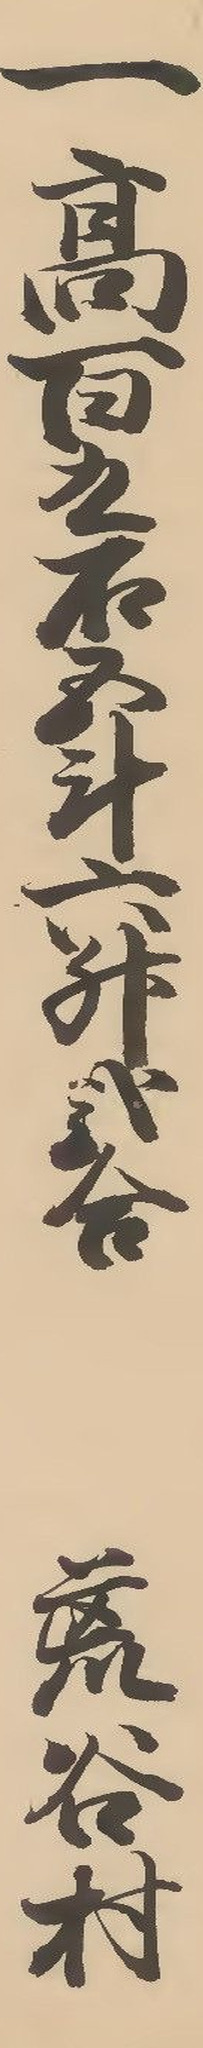一髙百九石五斗六升弐合荒谷村
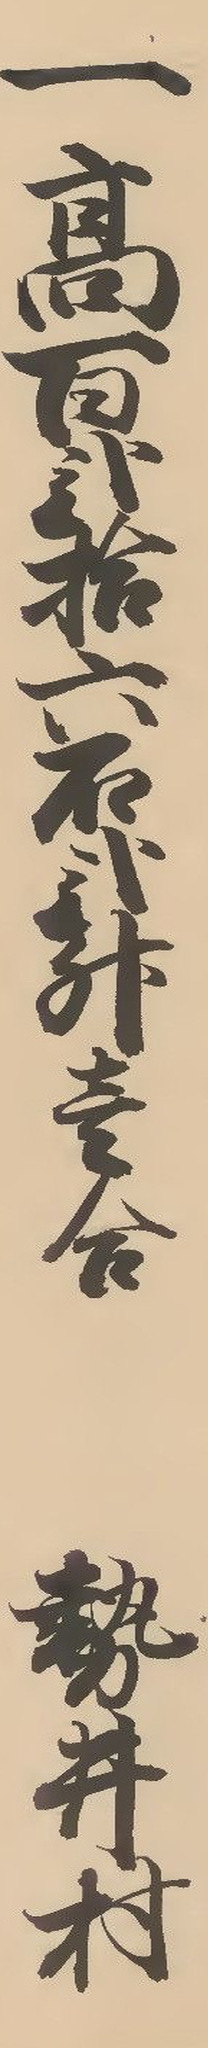一髙百弐拾六石弐升壱合勢井村
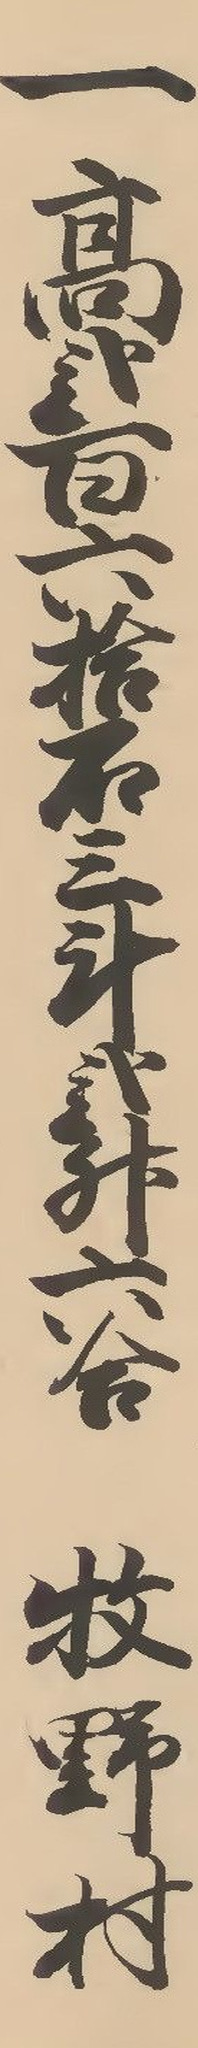一髙弐百六拾石三斗弐升六合牧野村
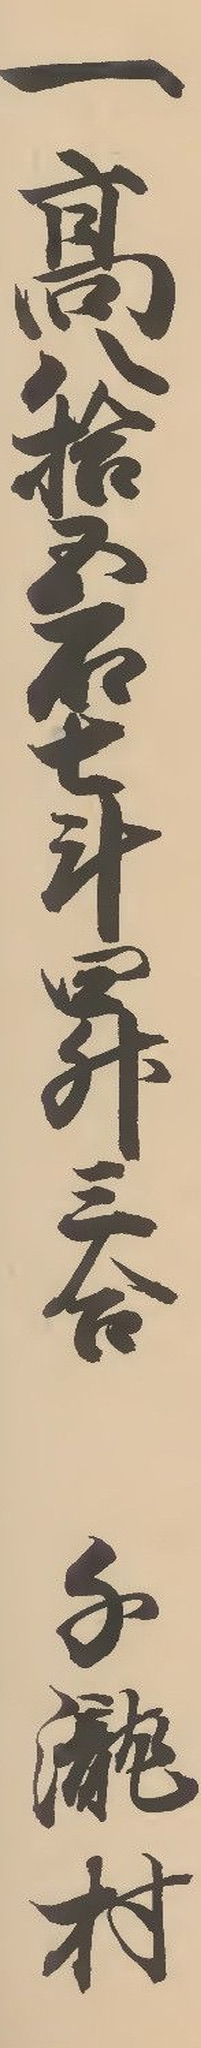一髙八拾五石七斗四升三合千瀧村
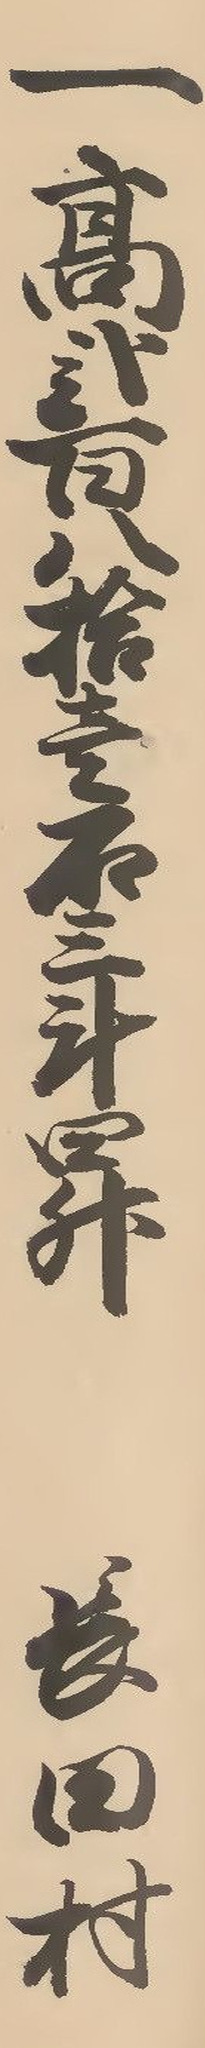一髙弐百八拾壱石三斗四升長田村
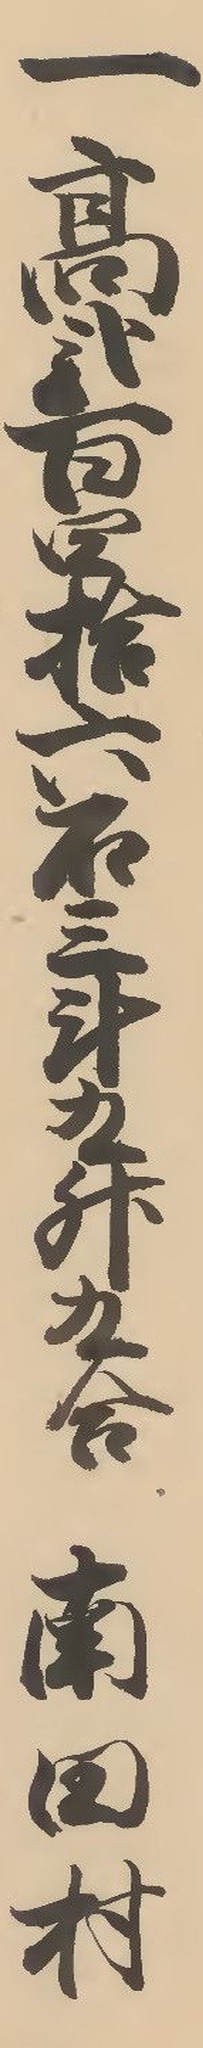一髙弐百四拾六石三斗九升九合南田村
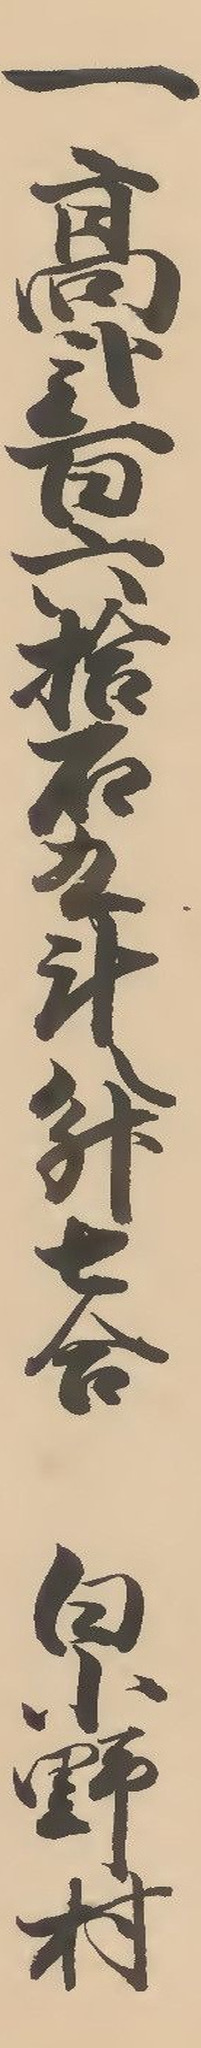一髙弐百六拾石九斗八升七合白小野村
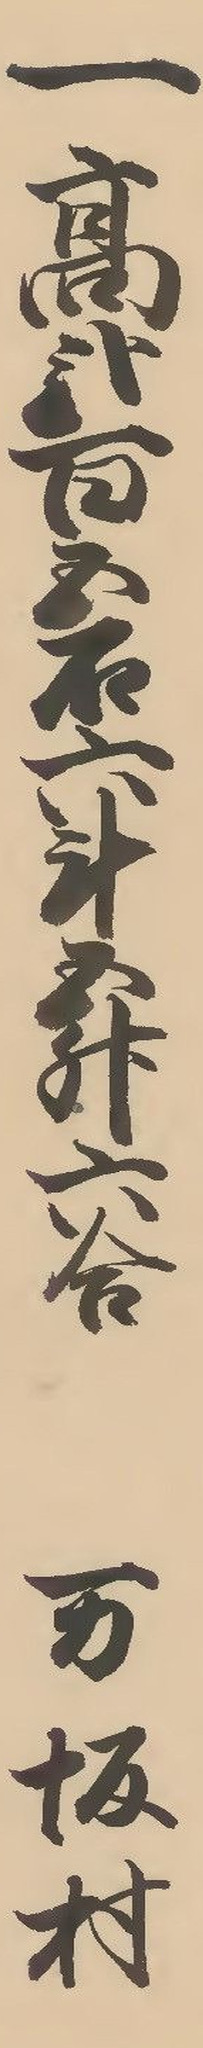一髙二百五石六斗五升六合万坂村

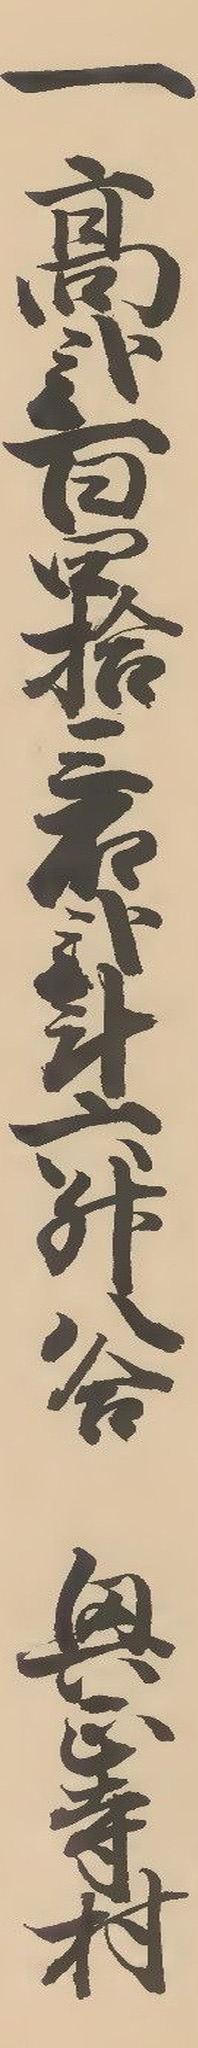一髙弐百四拾三石弐斗六升八合奥正寺村
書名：肥後国郷帳
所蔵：国立公文書館 National Archives of Japan
